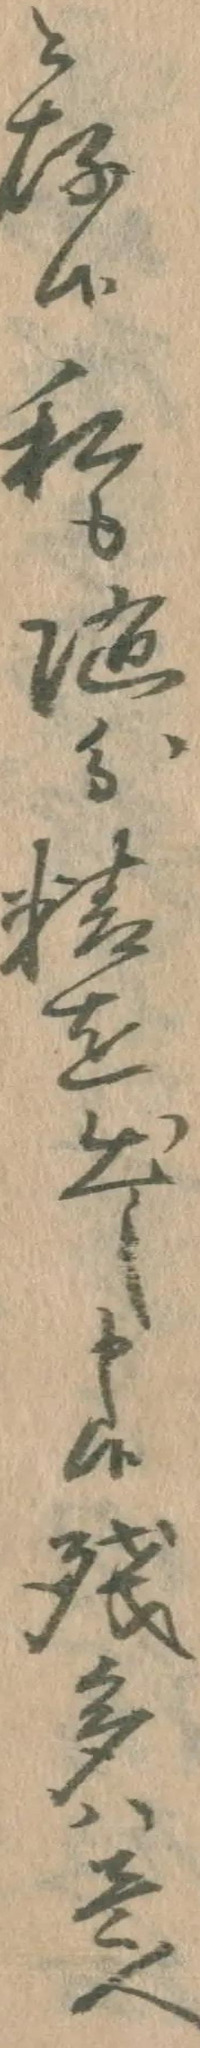と存候私も随分精を出し申候残多は壱人
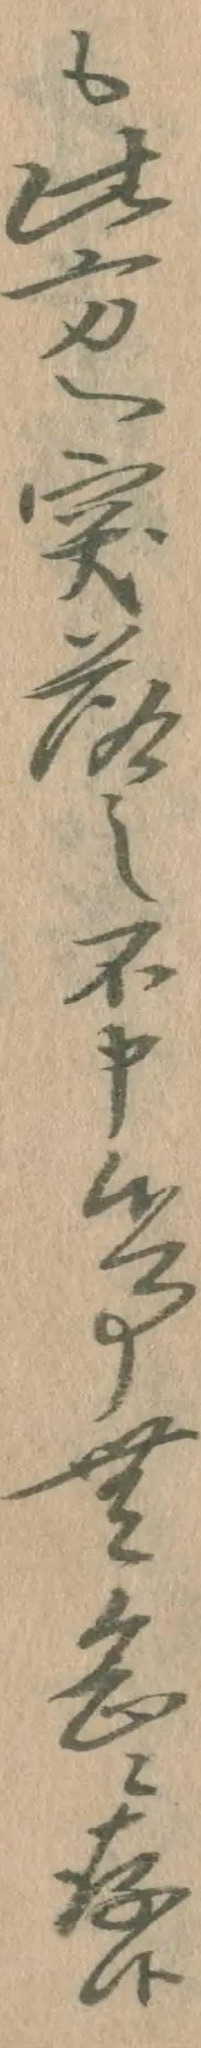も此方へ突落し不申候事無急に存候
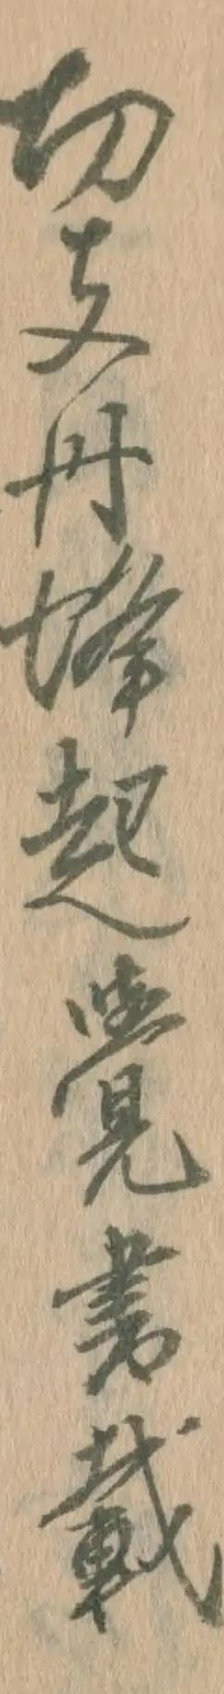切支丹蜂起覚書載
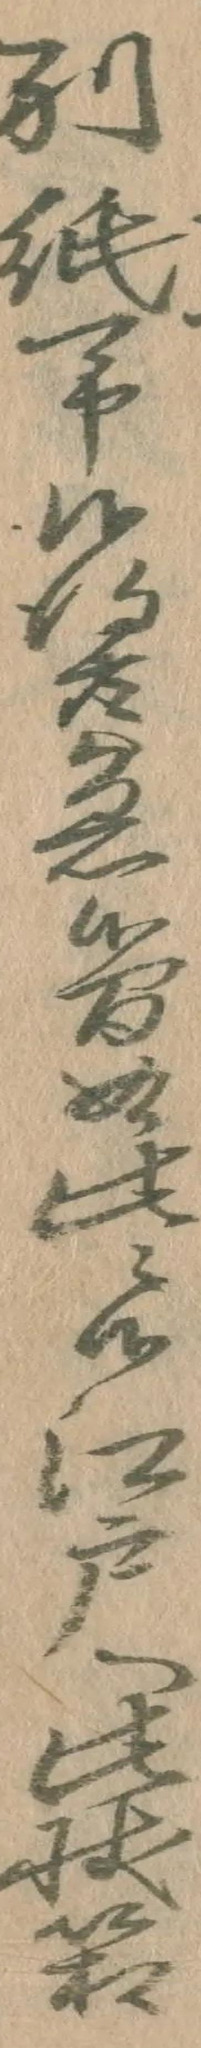別紙可申候得共急候間如此に候江戸へ此状箱
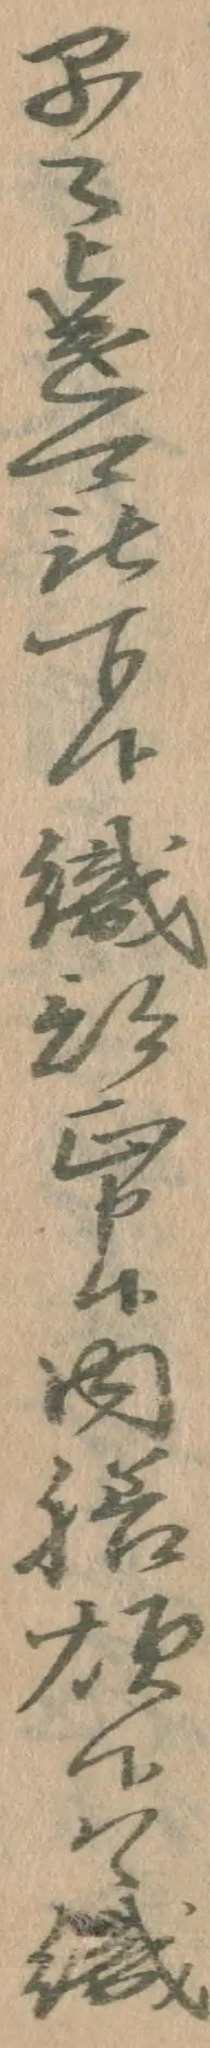早々被遣可被下候織部正申候内膳煩候はゝ織
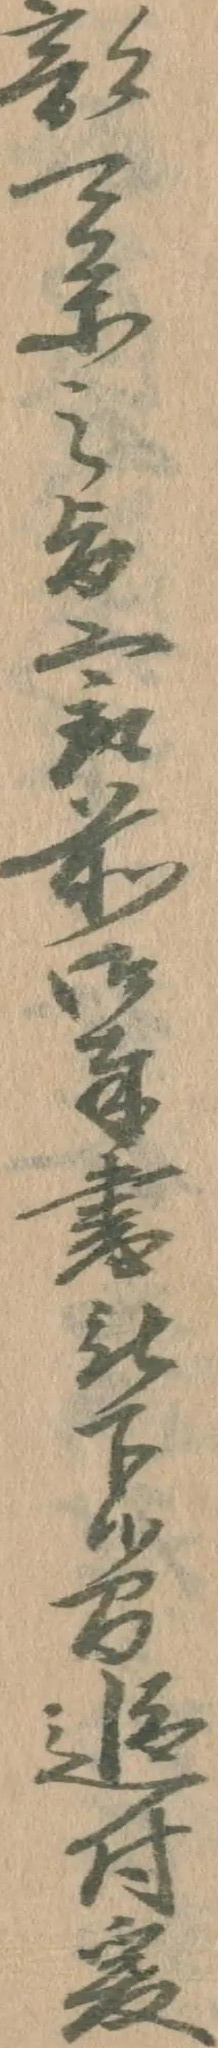部可参之旨最前御奉書被下候間追付爰
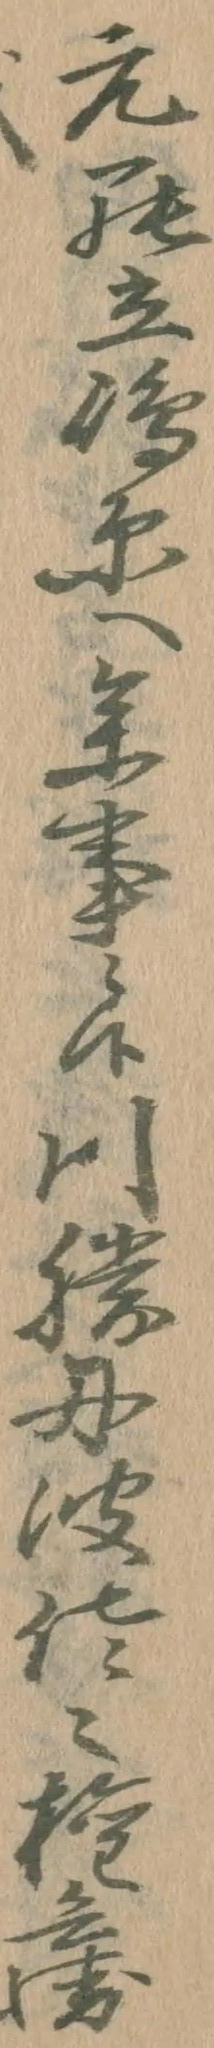元罷立島原へ参事に候川勝丹波佐々権兵衛
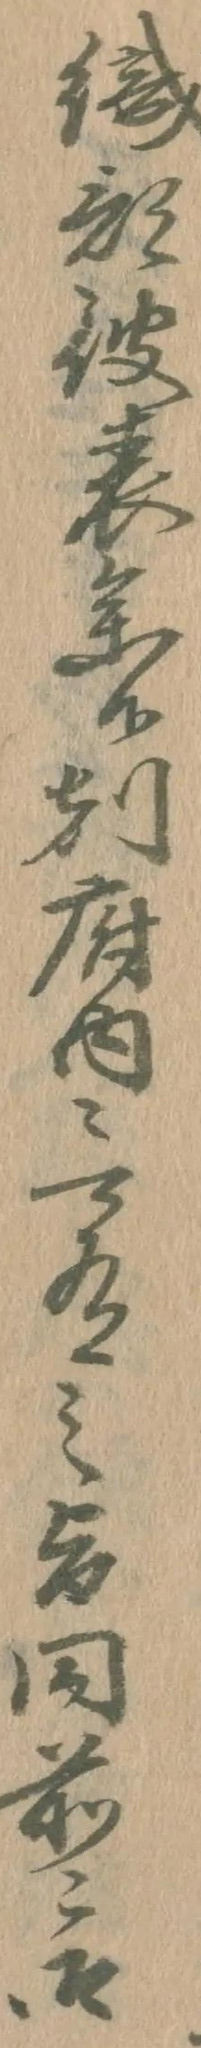織部彼表参候刻府内に可有之旨同前に御
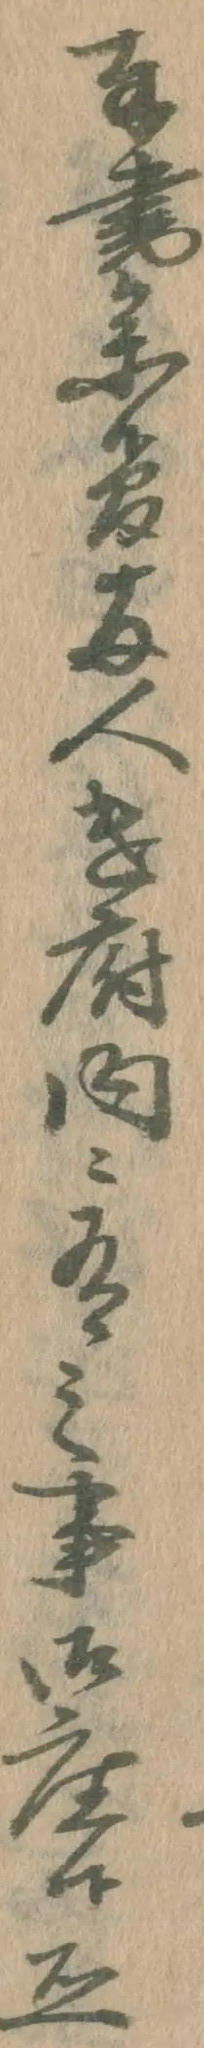奉書参候間両人遣府内に有之事御座候恐
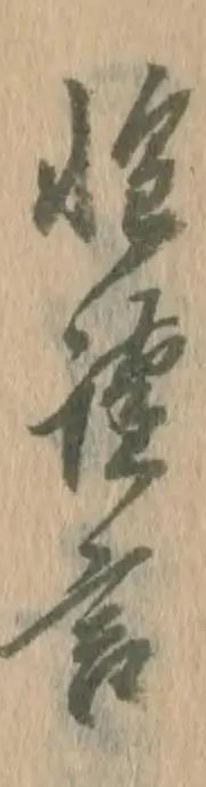惶謹言
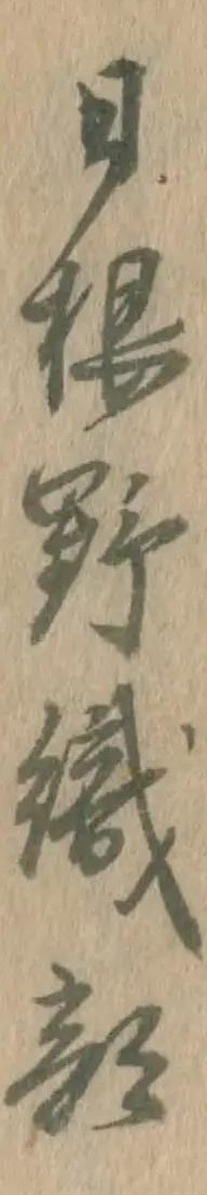日根野織部
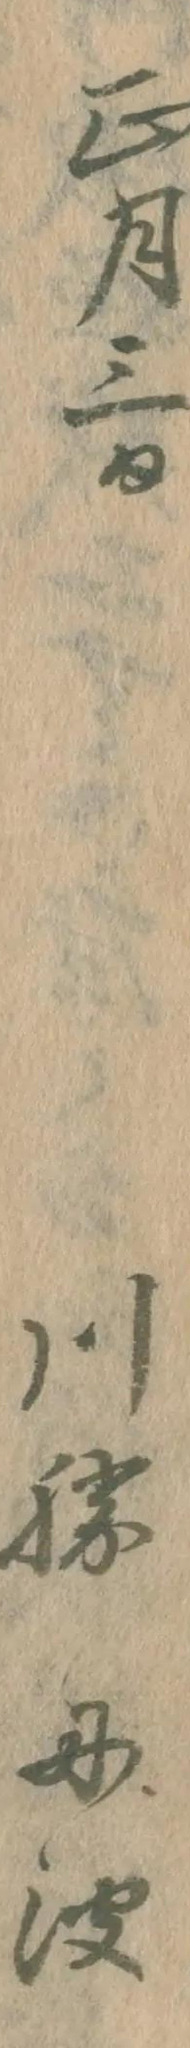正月三日川勝丹波
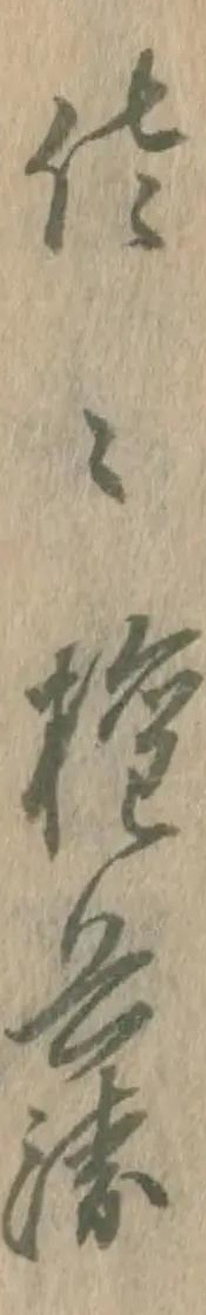佐々権兵衛
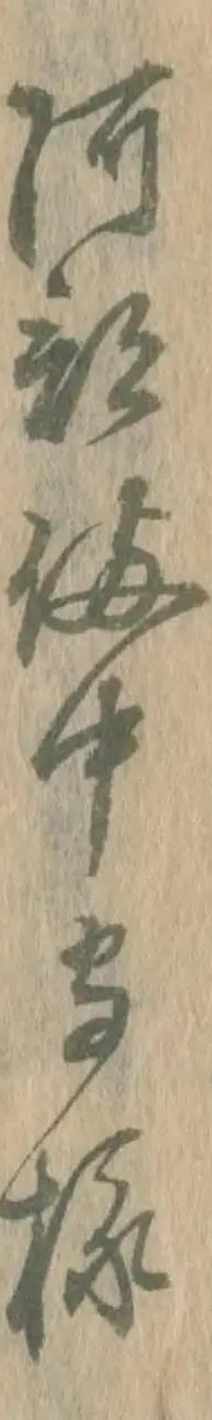阿部備中守様
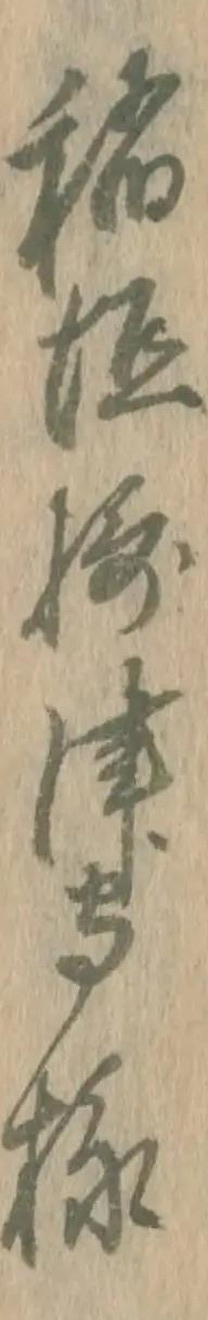稲垣摂津守様
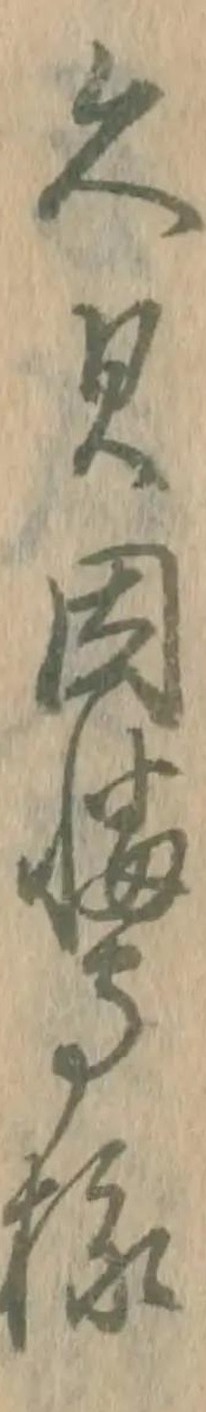久貝因幡守様
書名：切支丹御退治記 49巻. [5]
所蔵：国立国会図書館 National Diet Library, JAPAN
